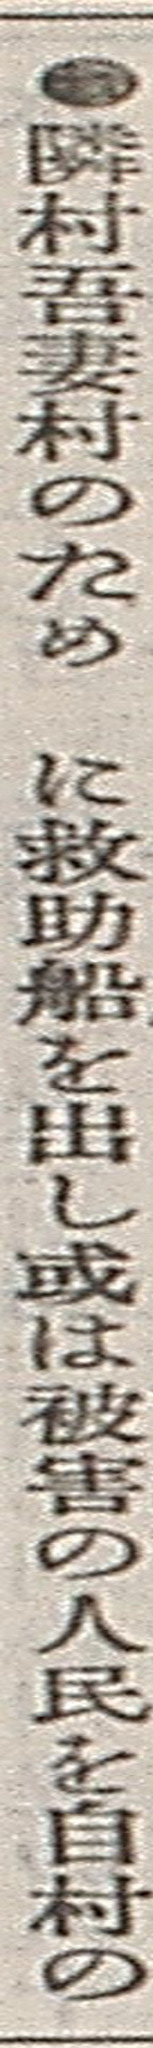●隣村吾妻村のために救助船を出し或は被害の人民を自村の
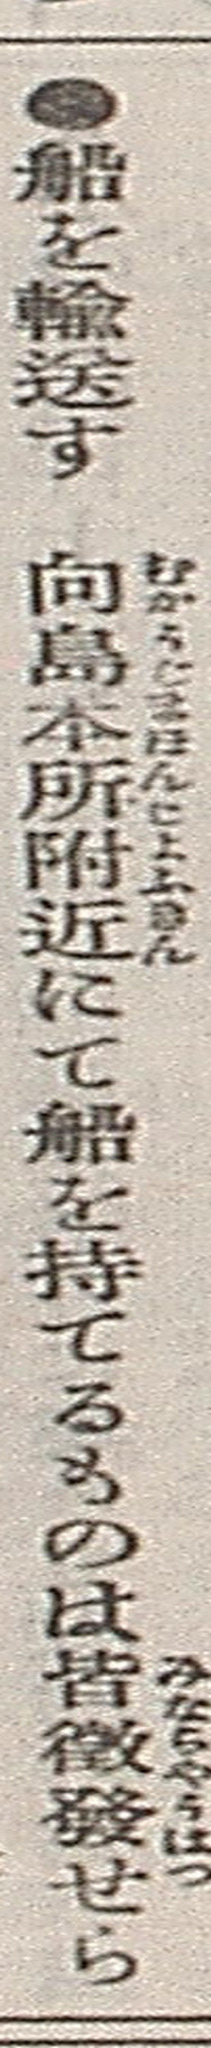●船を輸送す向島本所附近にて船を持てるものは皆徴発せら
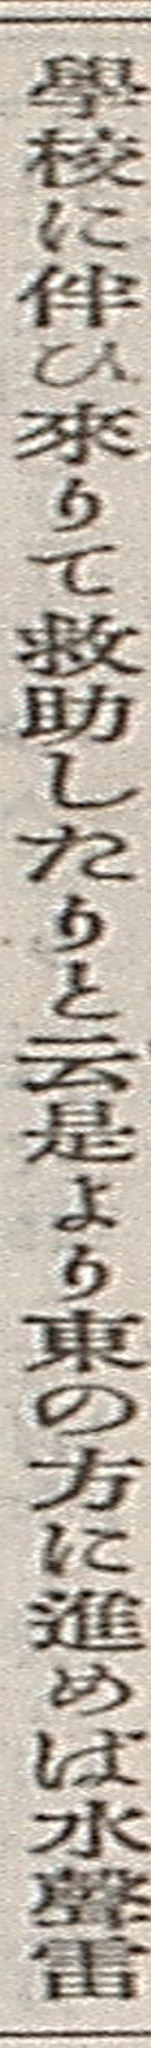学校に伴い来りて救助したりと云是より東の方に進めば水声雷
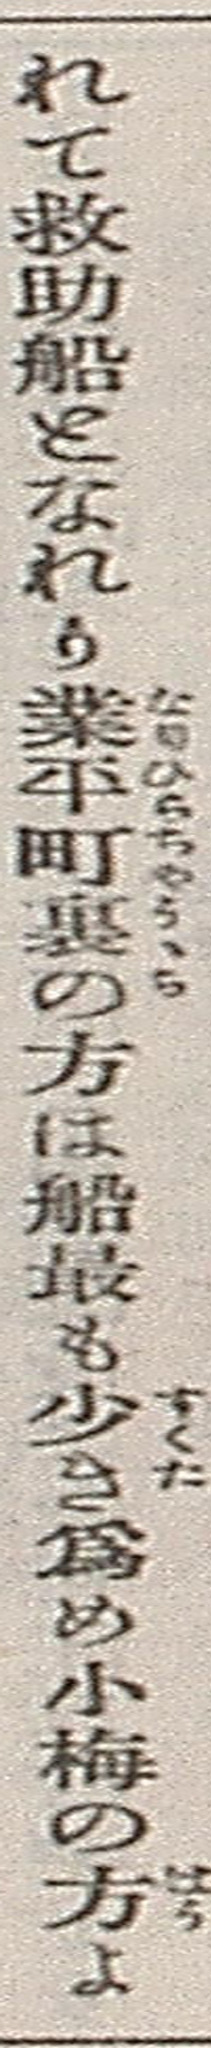れて救助船となれり業平町裏の方は船最も少き為め小梅の方よ
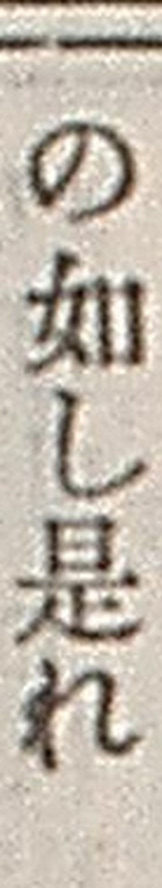の如し是れ
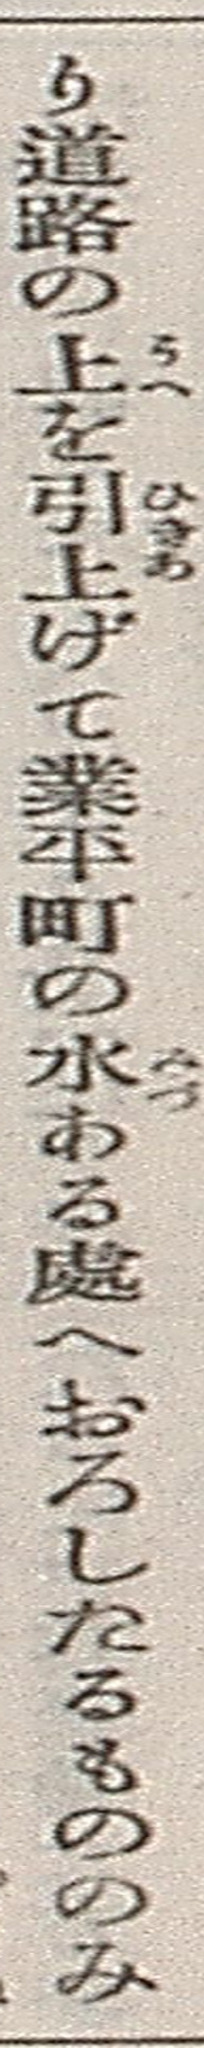り道路の上を引上げて業平町の水ある処へおろしたるもののみ
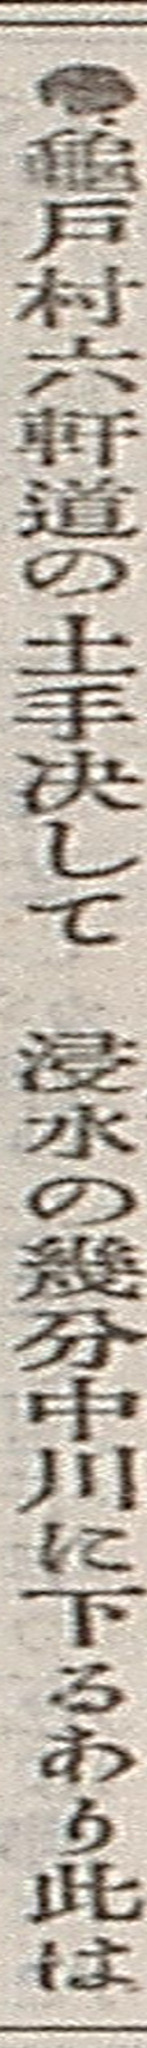●亀戸村六軒道の土手决して浸水の幾分中川に下るあり此は
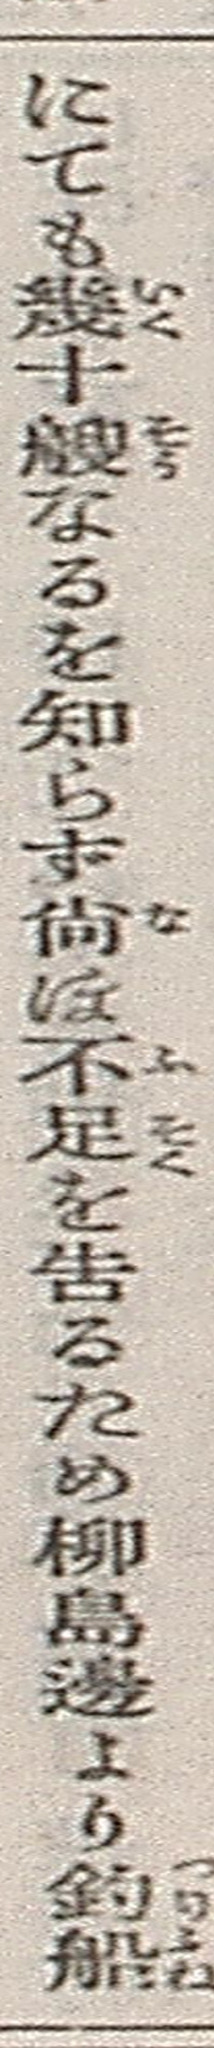にても幾十艘なるを知らず尚ほ不足を告るため柳島辺より釣船
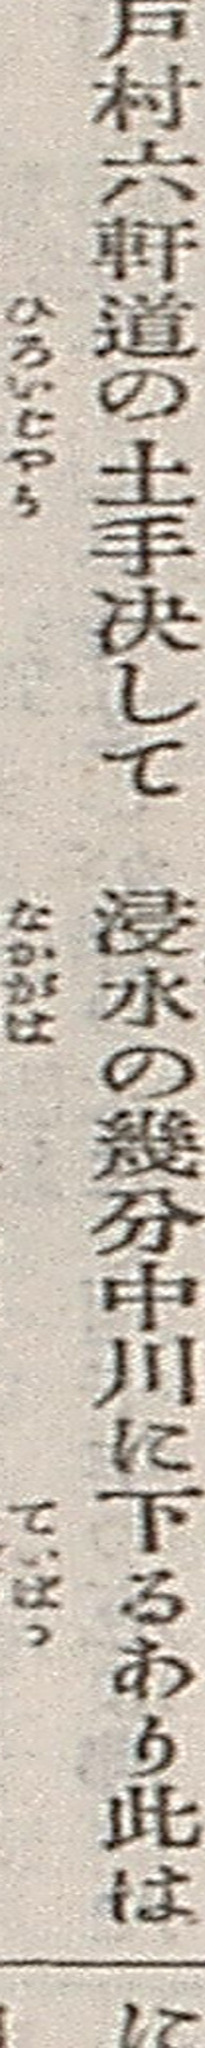●亀戸村六軒道の土手决して浸水の幾分中川に下るあり此は
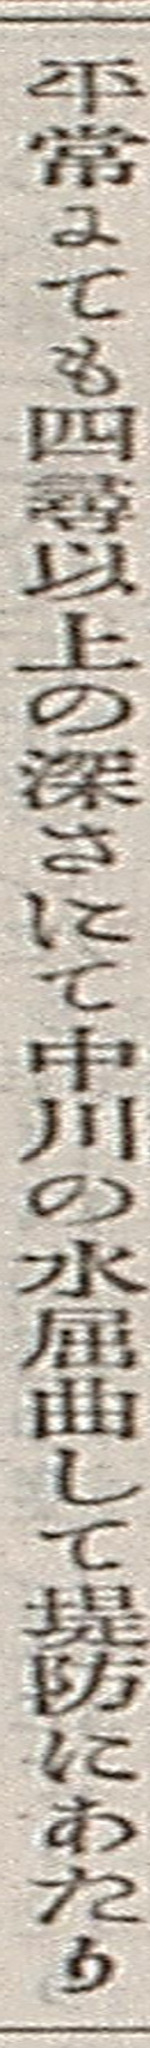平常にても四尋以上の深さにて中川の水屈曲して堤防にあたり
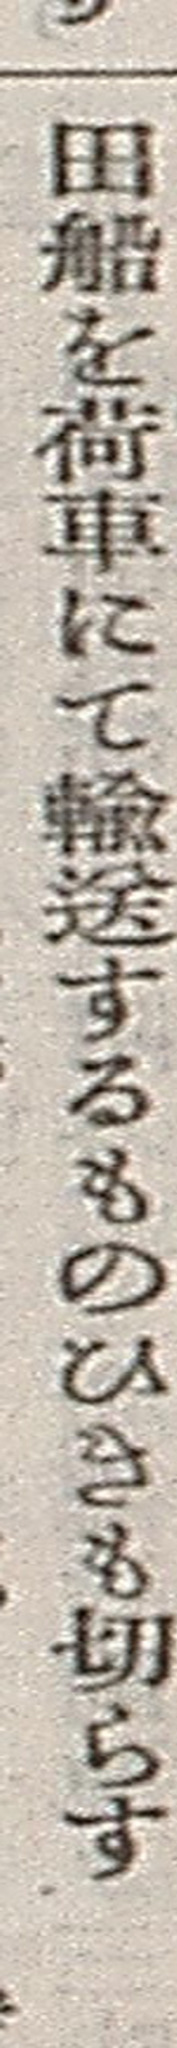田船を荷車にて輸送するものひきも切らす
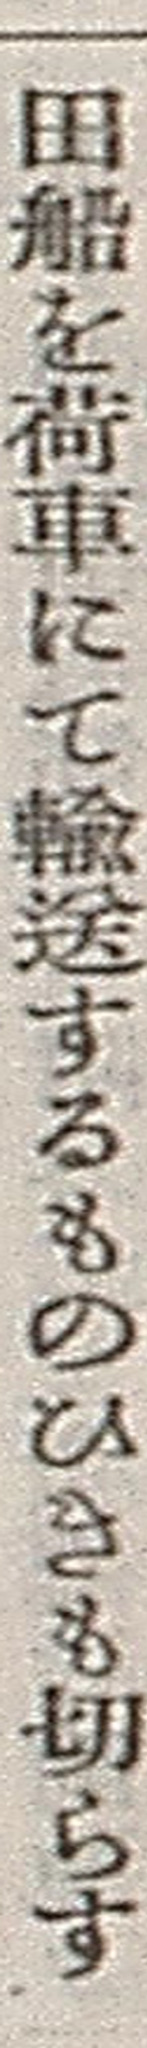田船を荷車にて輸送するものひきも切らす
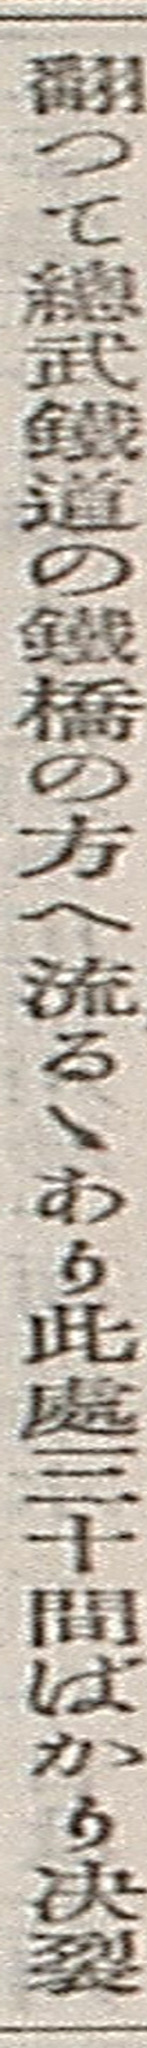翻つて総武鉄道の鉄橋の方へ流るゝあり此処三十間ばかり决裂
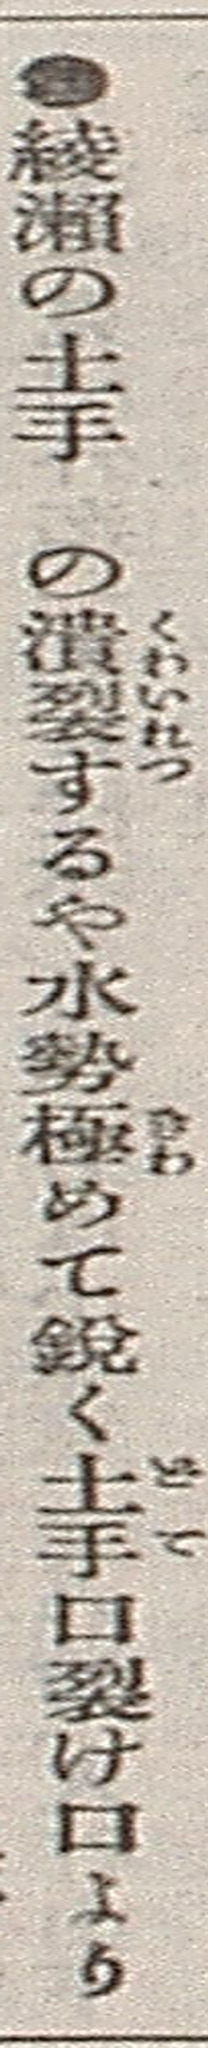●綾瀬の土手の潰裂するや水勢極めて鋭く土手口裂け口より
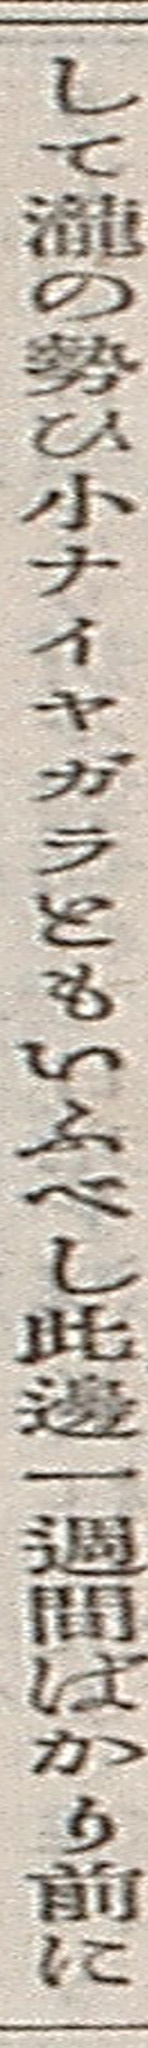して瀧の勢ひ小ナイヤガラともいふべし此辺一週間ばかり前に
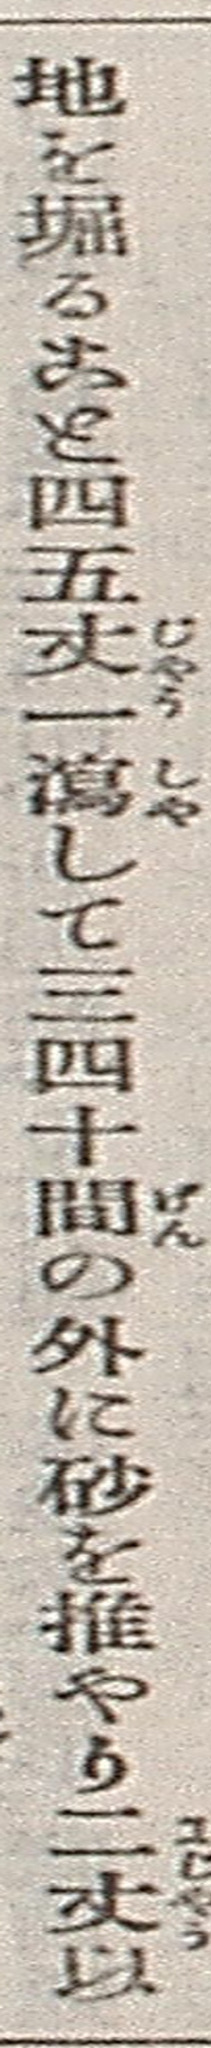地を堀ること四五丈一瀉して三四十間の外に砂を推やり二丈以
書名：風俗畫報臨時増刊第百二十四號　洪水地震被害録（上）
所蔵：東京大学地震研究所図書室 Earthquake Research Institute Library, The University of Tokyo, JAPAN
